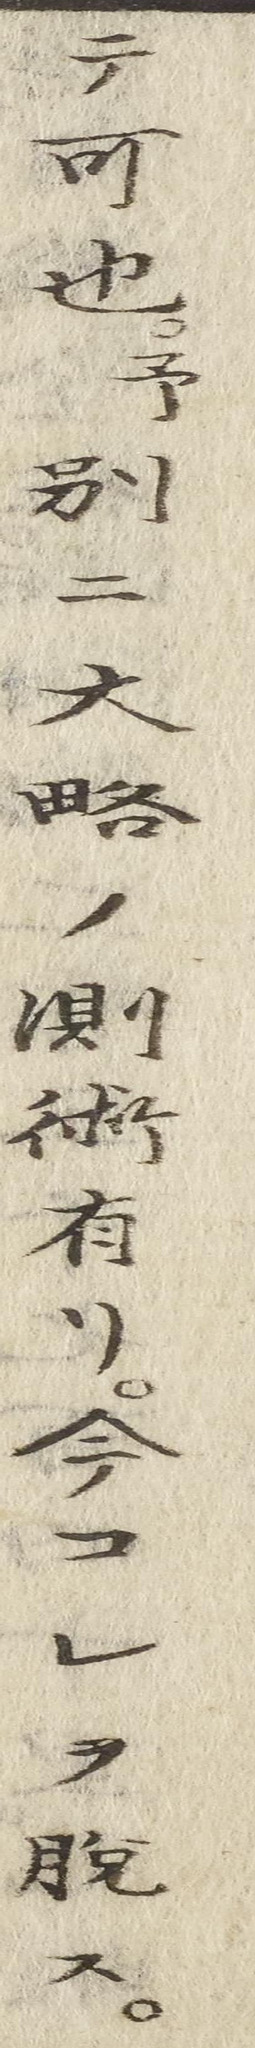テ可也。予別ニ大略ノ測術有リ。今コレヲ脱ス。
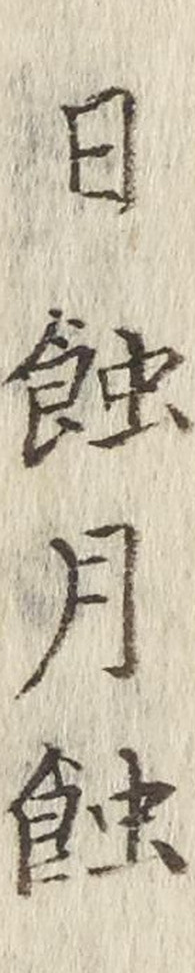日蝕月蝕
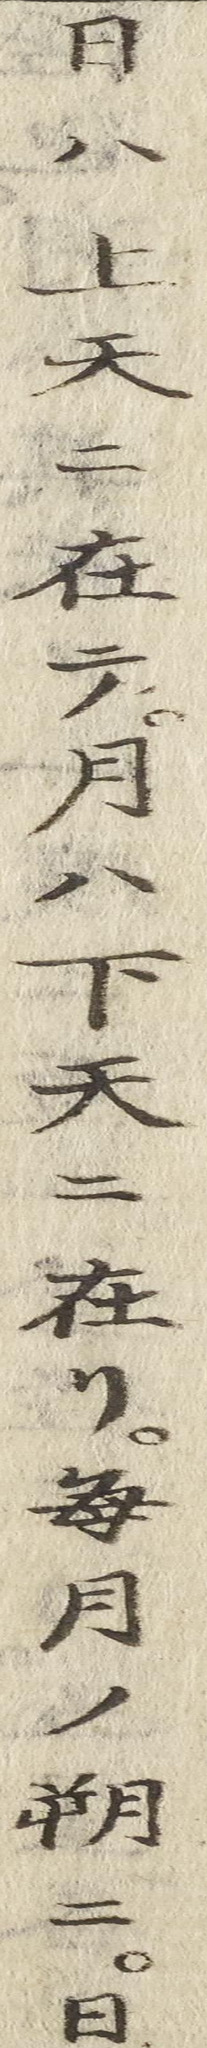日ハ上天ニ在テ。月ハ下天ニ在リ。毎月ノ朔ニ。日
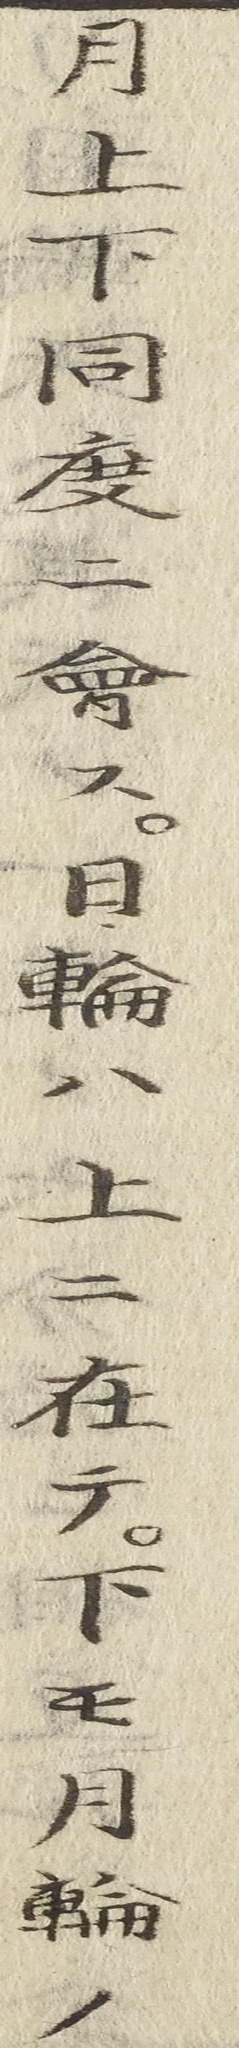月上下同度ニ会ス。日輪ハ上ニ在テ。下モ月輪ノ
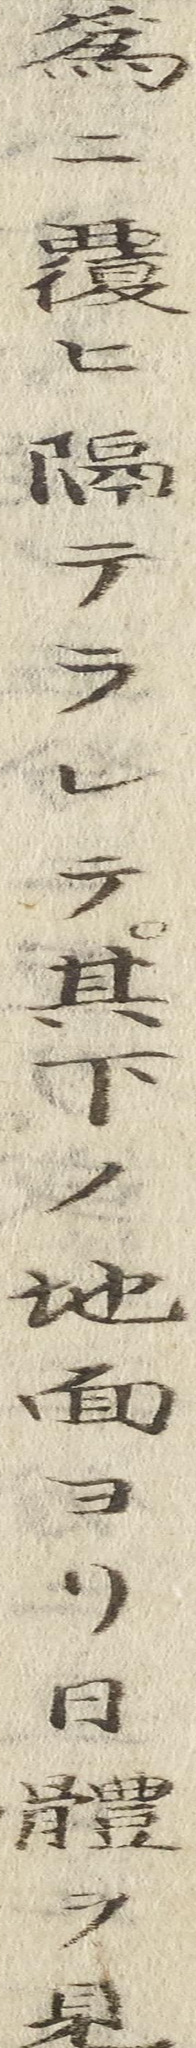為ニ覆ヒ隔テラレテ。其下ノ地面ヨリ日体ヲ見
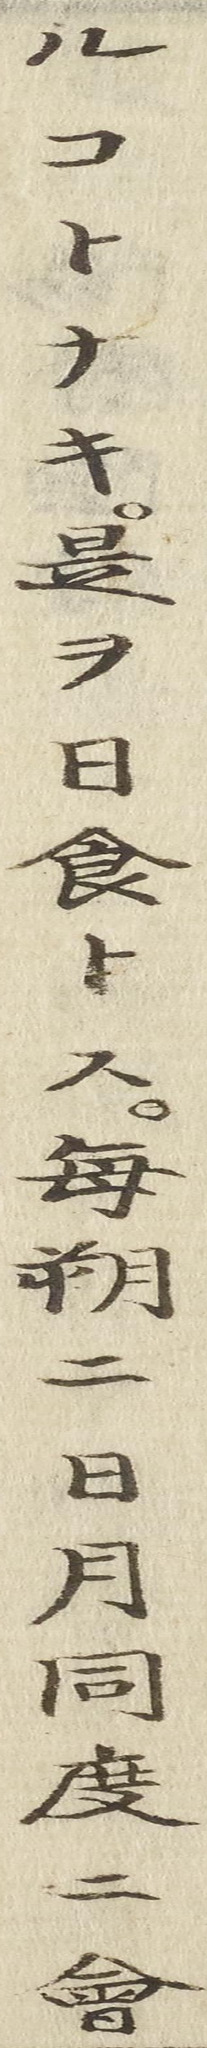ルコトナキ。是ヲ日食トス。毎朔ニ日月同度ニ会
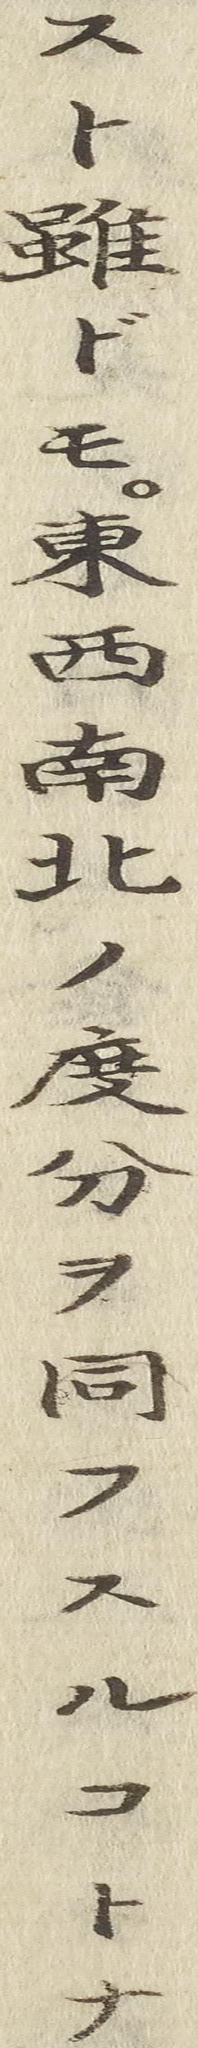スト雖ドモ。東西南北ノ度分ヲ同フスルコトナ
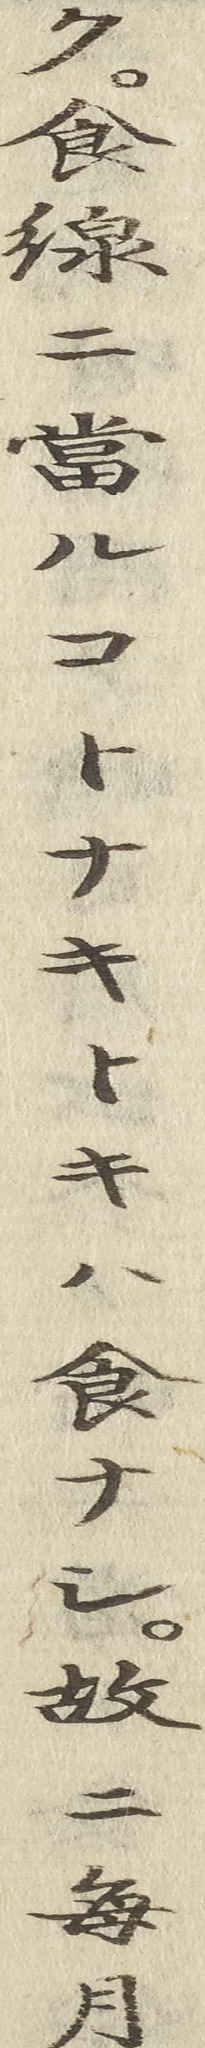ク。食線ニ当ルコトナキトキハ食ナシ。故ニ毎月
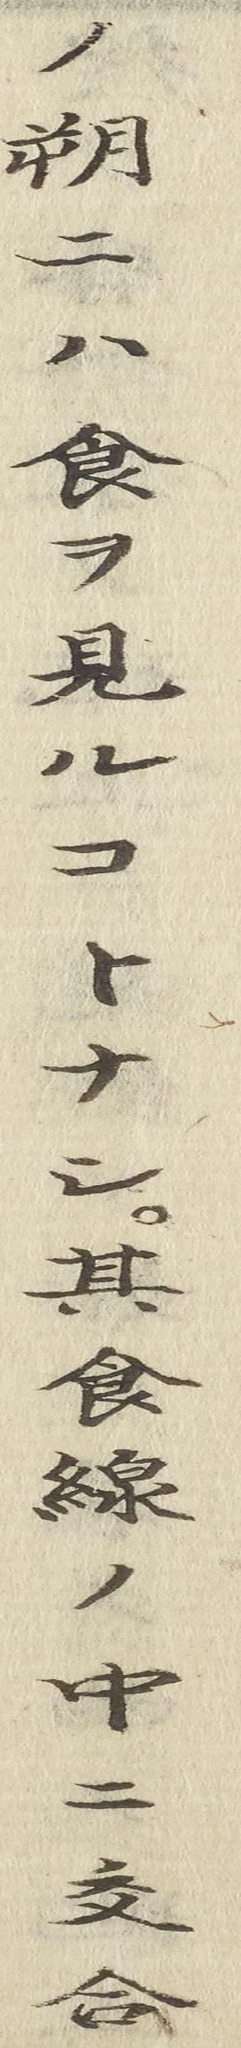ノ朔ニハ食ヲ見ルコトナシ。其食線ノ中ニ交合
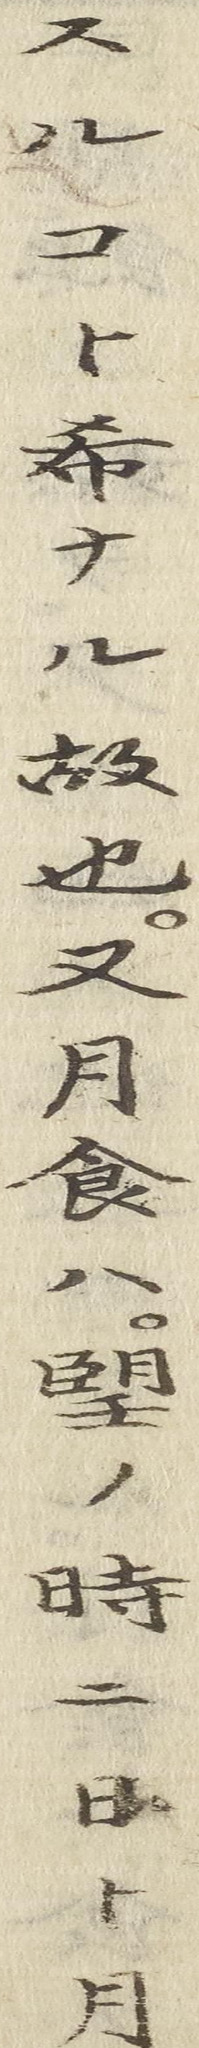スルコト希ナル故也。又月食ハ。望ノ時ニ日ト月
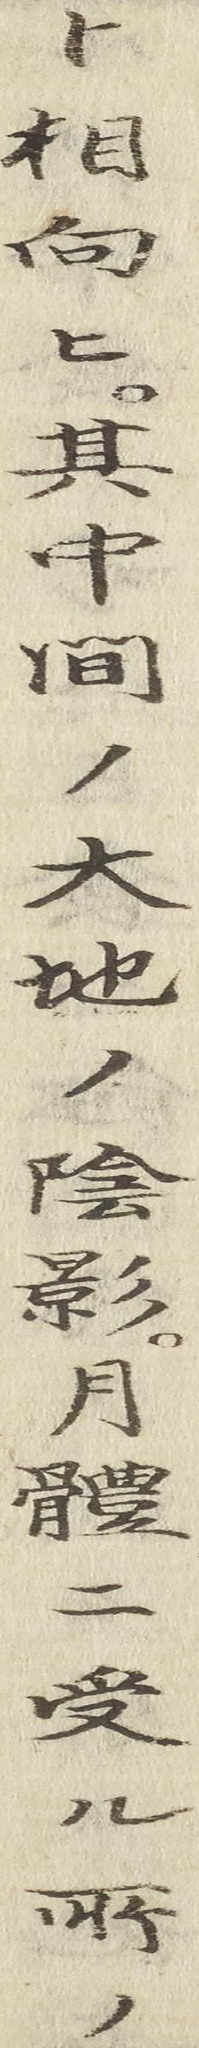ト相向ヒ。其中間ノ大地ノ陰影。月体ニ受ル所ノ
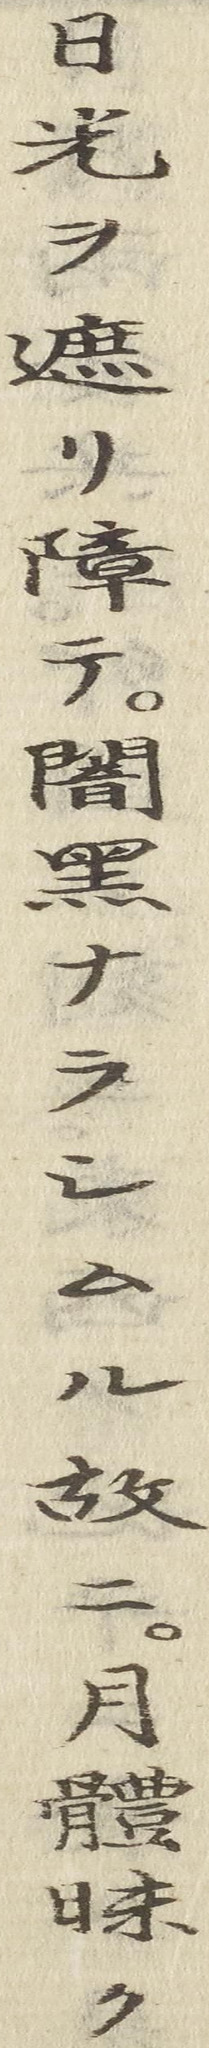日光ヲ遮リ障テ。闇黒ナラシムル故ニ。月体昧ク
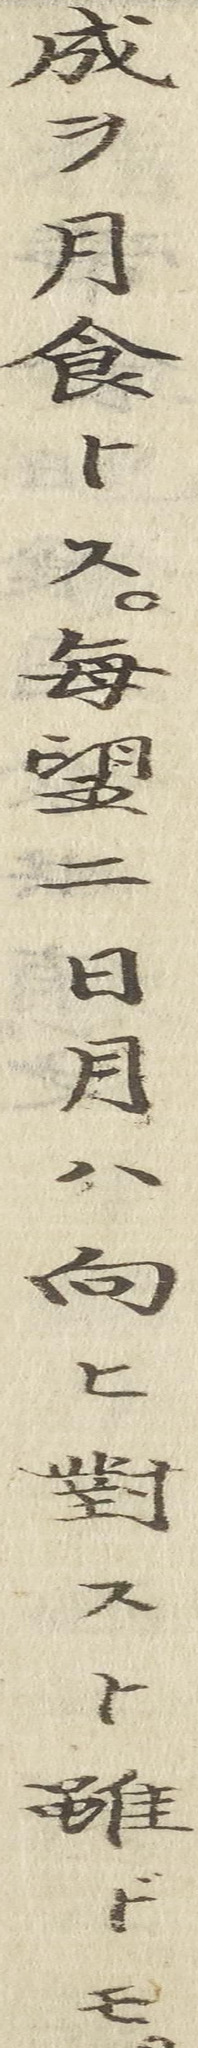成ヲ月食トス。毎望ニ日月ハ向ヒ対スト雖ドモ。
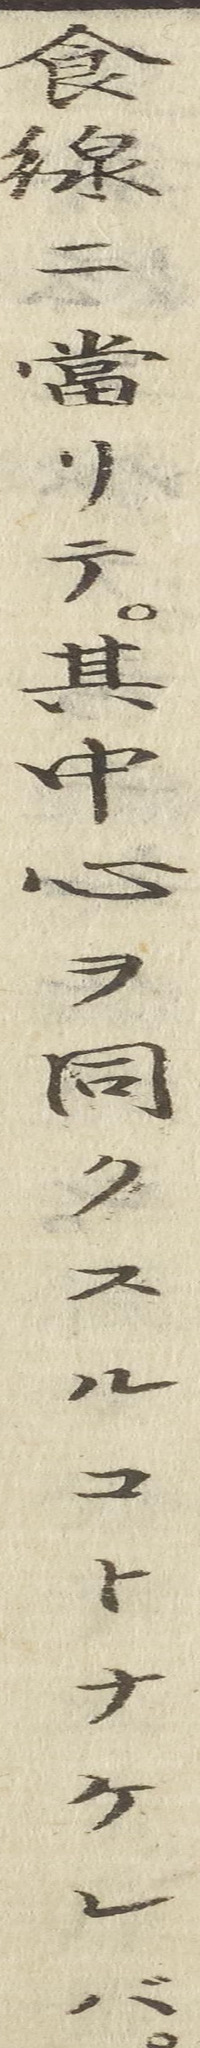食線ニ当リテ。其中心ヲ同クスルコトナケレバ。
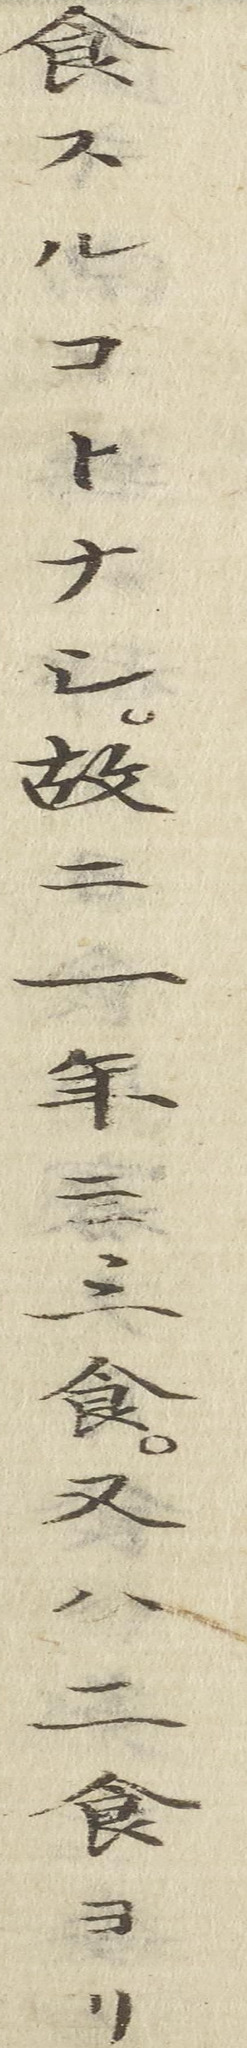食スルコトナシ。故ニ一年二三食。又ハ二食ヨリ

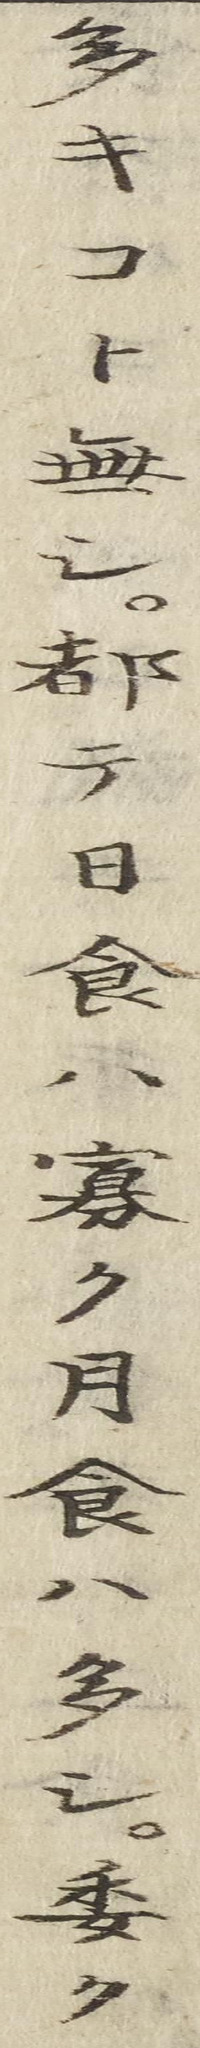多キコト無シ。都テ日食ハ寡ク月食ハ多シ。委ク
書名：大略天学名目鈔　天經或問附録
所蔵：東京大学地震研究所図書室 Earthquake Research Institute Library, The University of Tokyo, JAPAN
